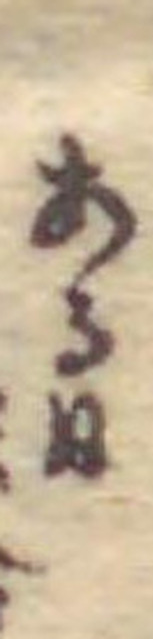ある日
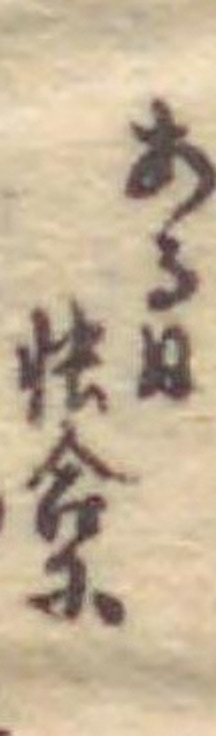帳合に
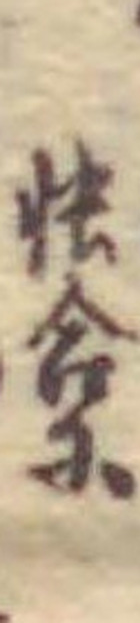帳合に
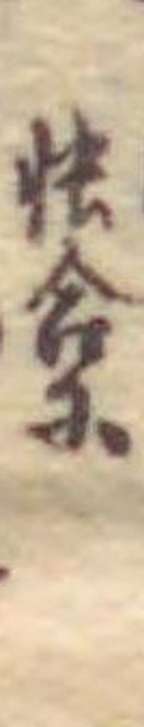帳合に
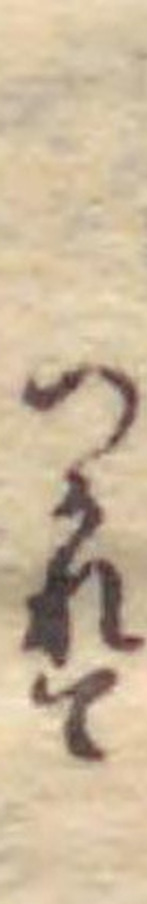つかれて
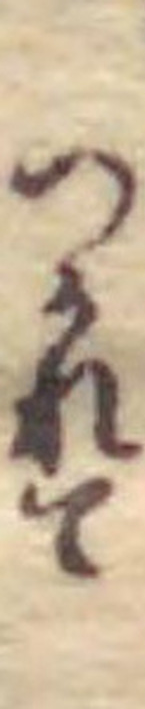つかれて
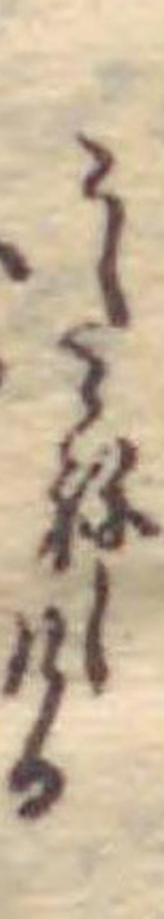うたゝねしける
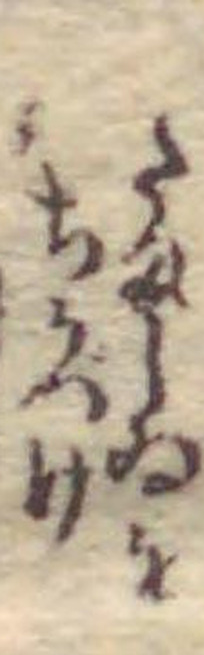ちかづけ
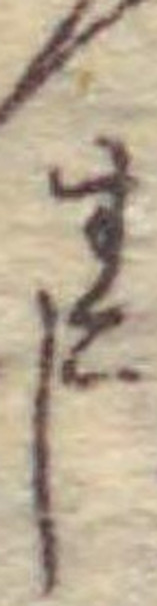すこし
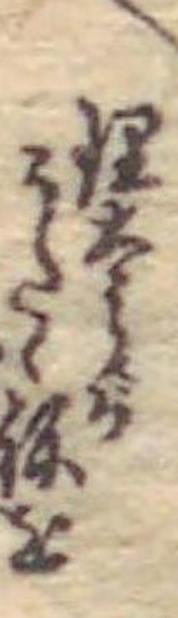うたゝねを
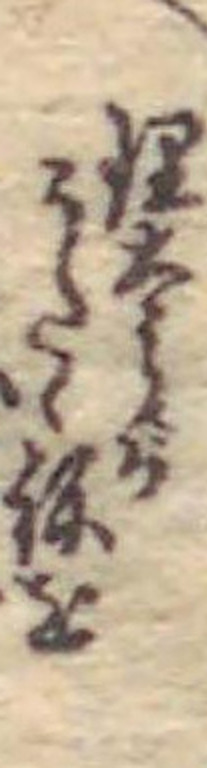うたゝねを
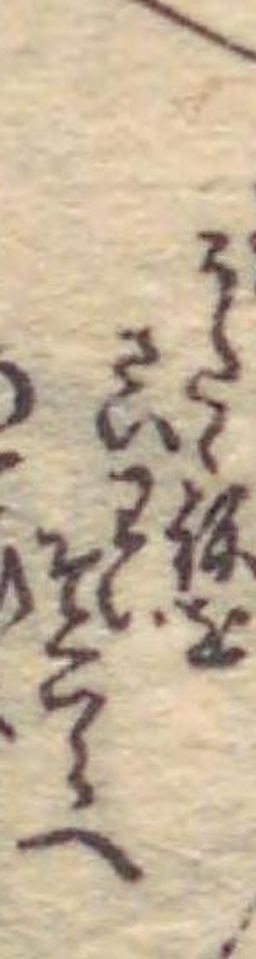さいわい
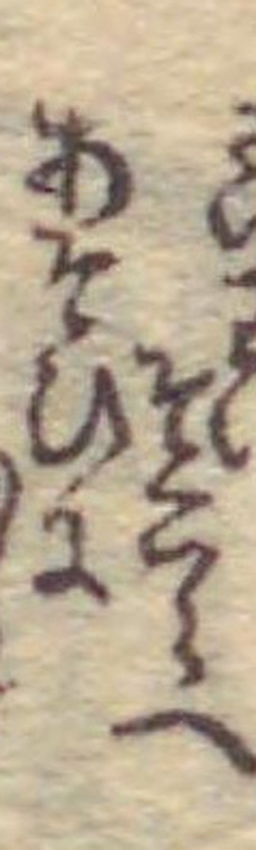あそひに
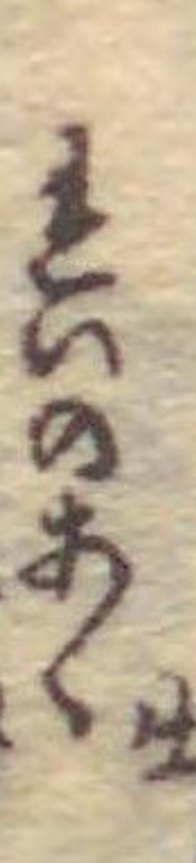れいのあく
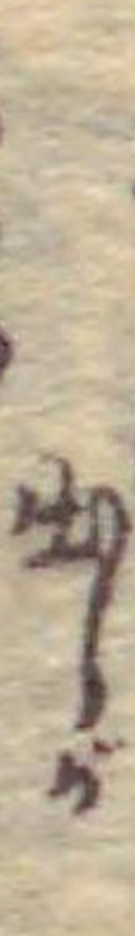出しが
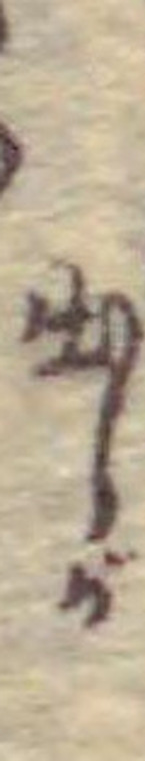出しが
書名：心学早染艸 : 3巻
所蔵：国立国会図書館 National Diet Library, JAPAN
